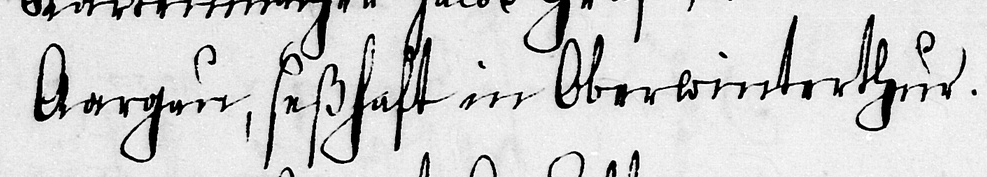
Aargau, seßhaft in Oberwinterthur.
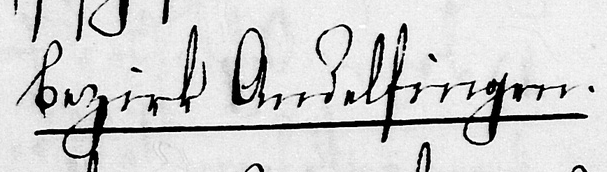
Bezirk Andelfingen.
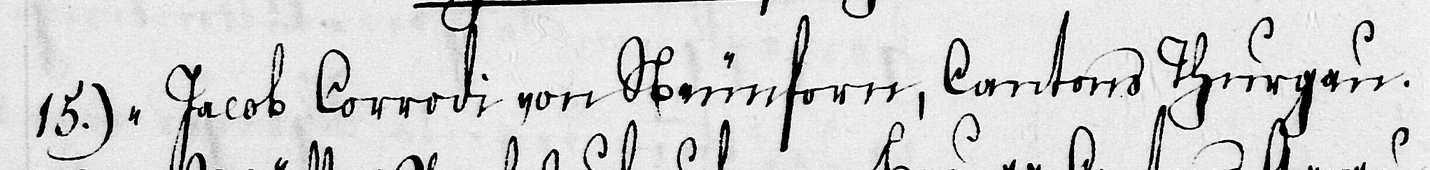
15.) “ Jacob Corrodi von Neunforn, Cantons Thurgau.
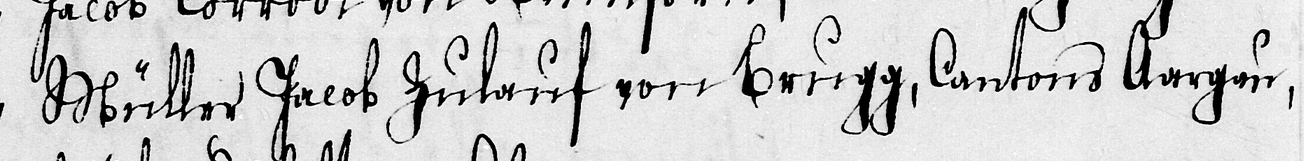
Müller Jacob Zulauf von Brugg, Cantons Aargau,
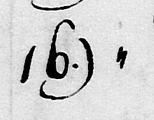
16.) “
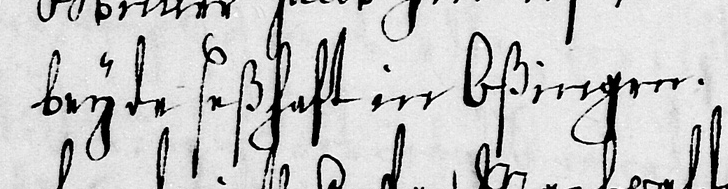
beyde seßhaft in Oßingen.
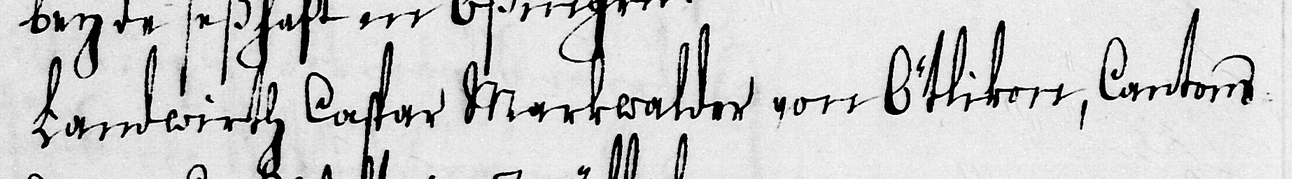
Landwirth Caspar Markwalder von Ötlikon, Cantons
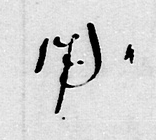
17.) “
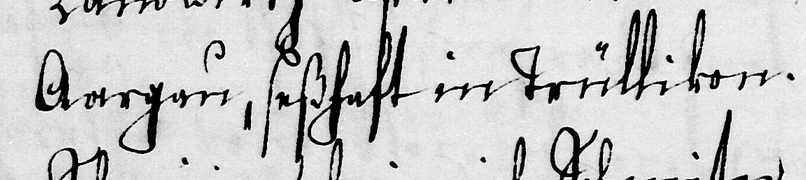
Aargau, seßhaft in Trüllikon.
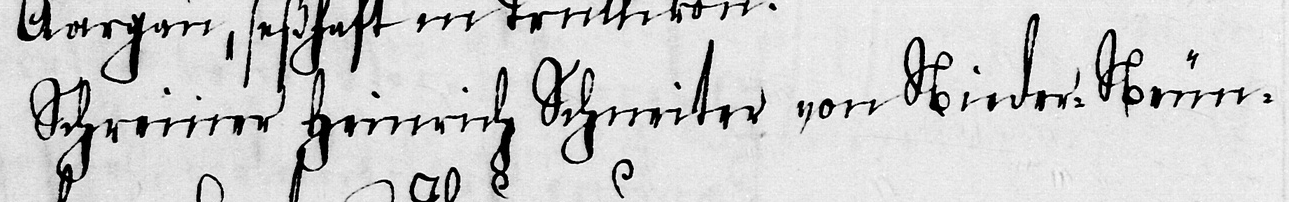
Schreiner Heinrich Schneiter von Nieder-Neun¬
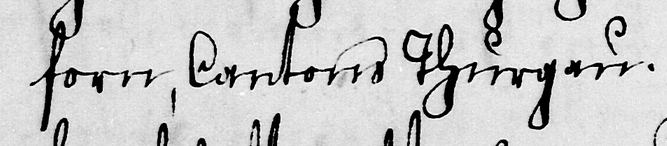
forn, Cantons Thurgau.
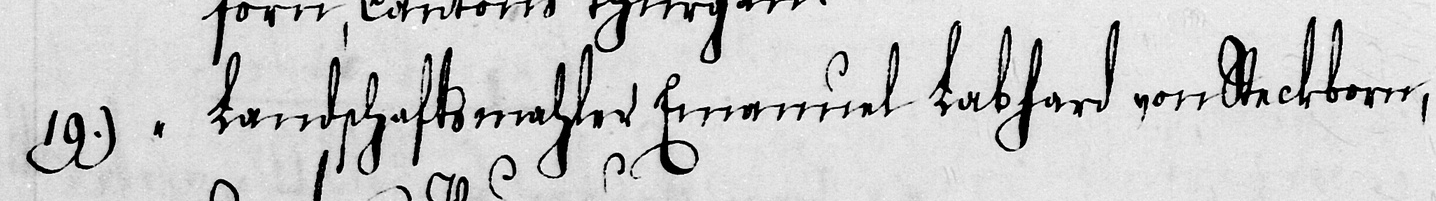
19.) “ Landschaftsmahler Emanuel Labhard von Steckborn,
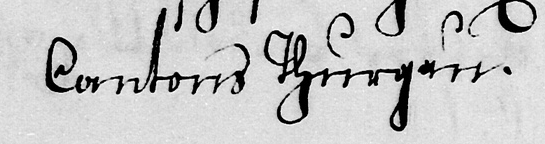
Cantons Thurgau.
